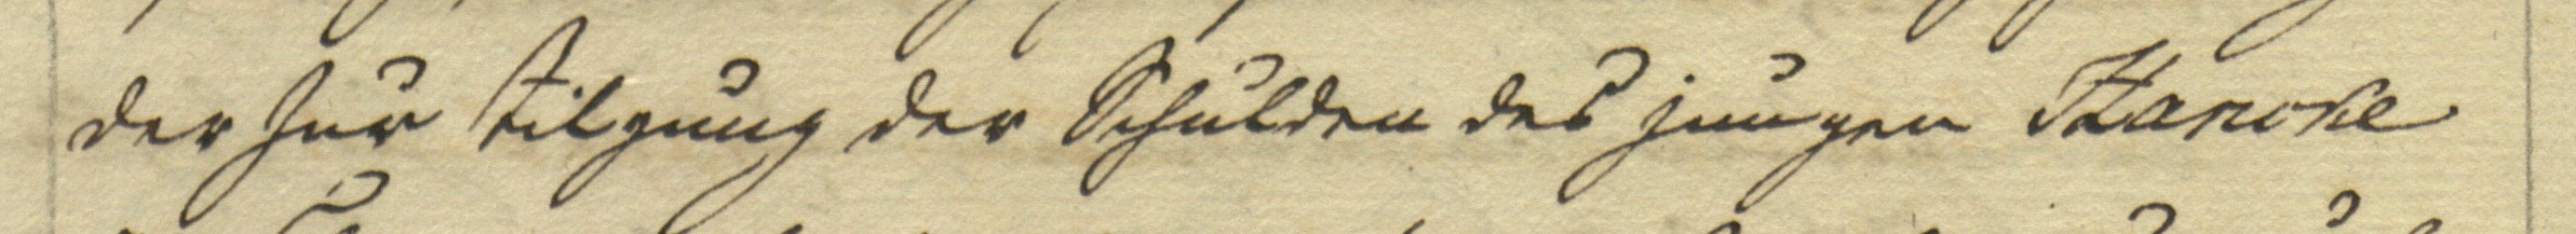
der zur Tilgung der Schulden des jungen Hancke
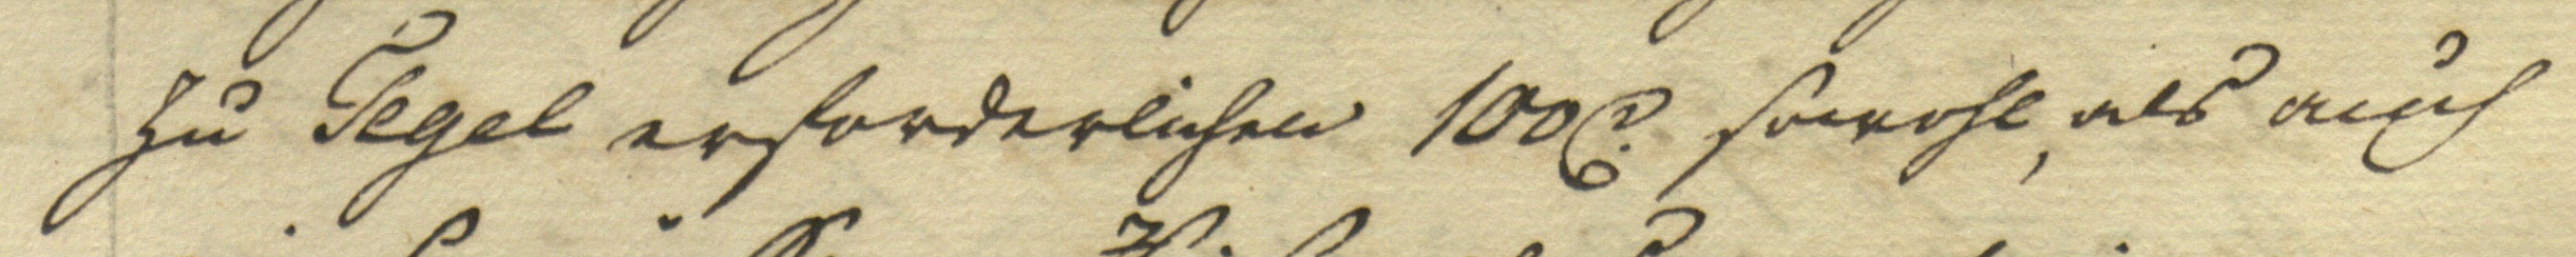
zu Tegel erforderlichen 100 l. sowohl, als auch
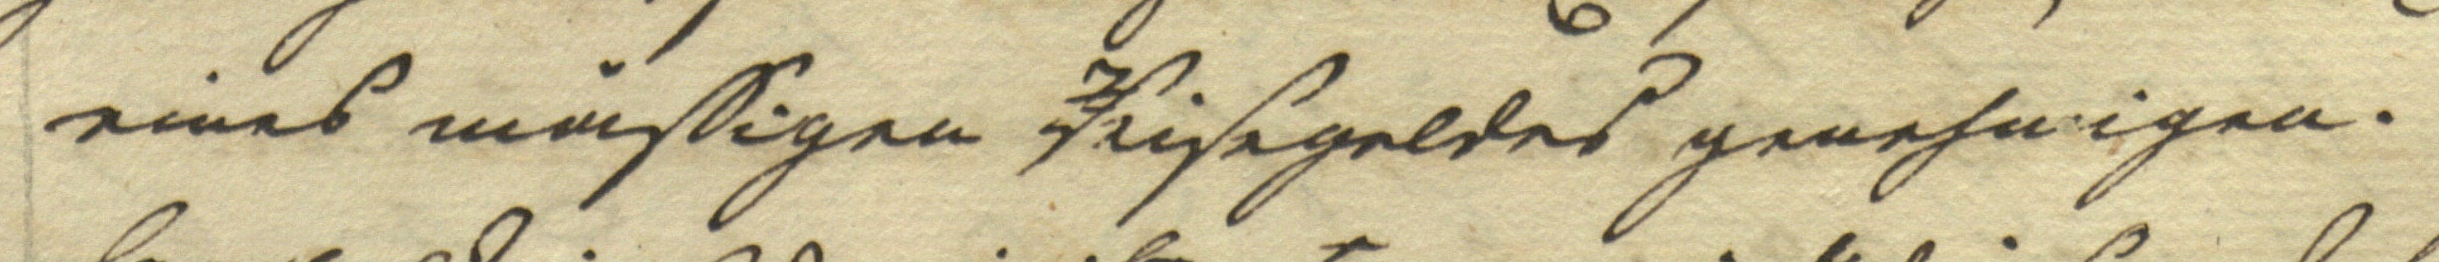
eines mäßigen Reisegeldes genehmigen.
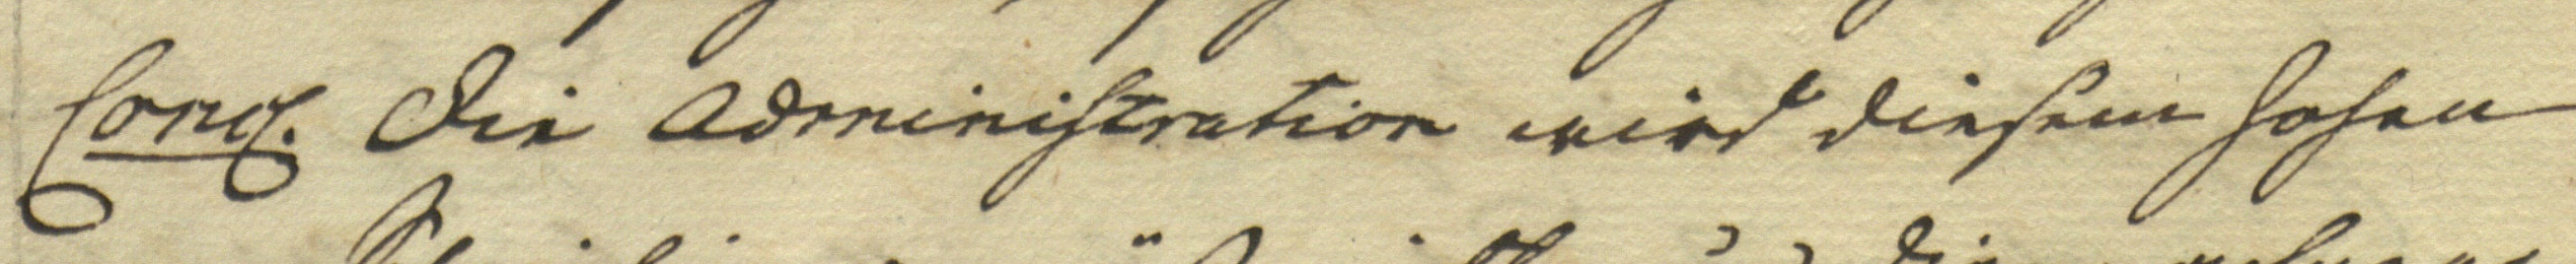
Concl. Die Administration wird diesem Hohen
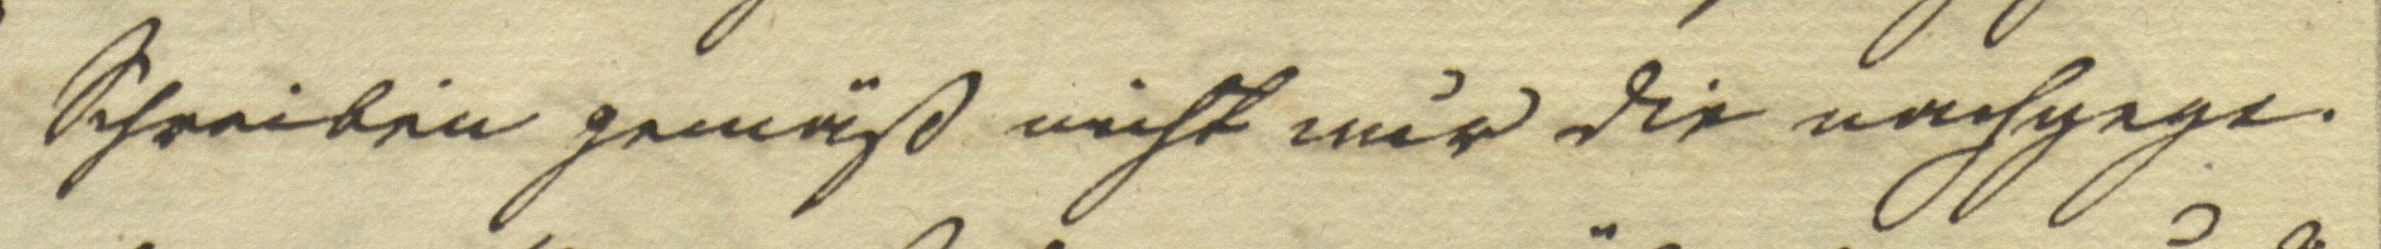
Schreiben gemäß nicht nur die nachgege¬
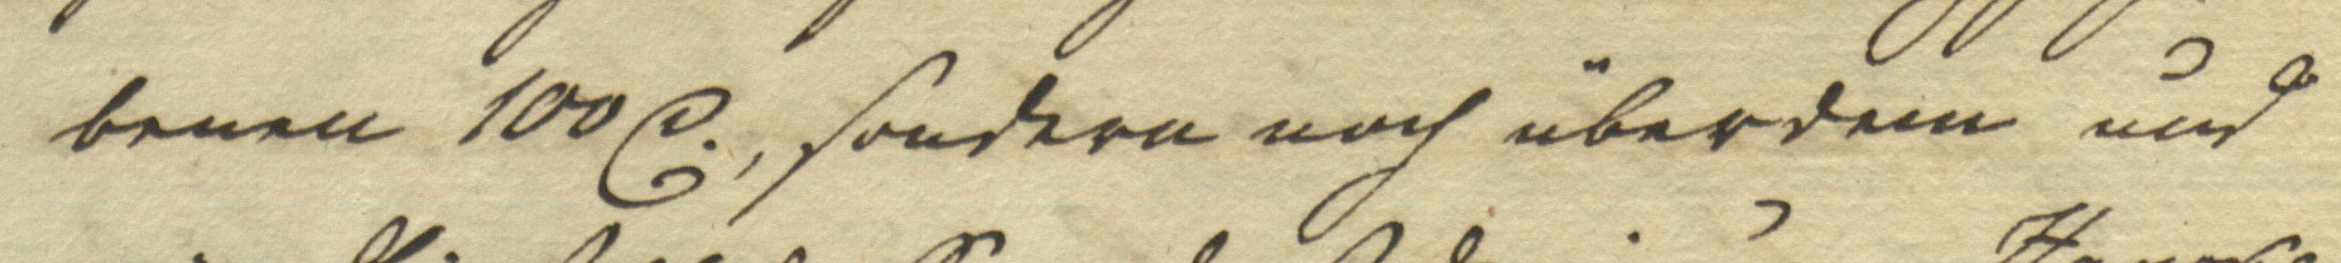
benen 100 l., sondern noch überdem und
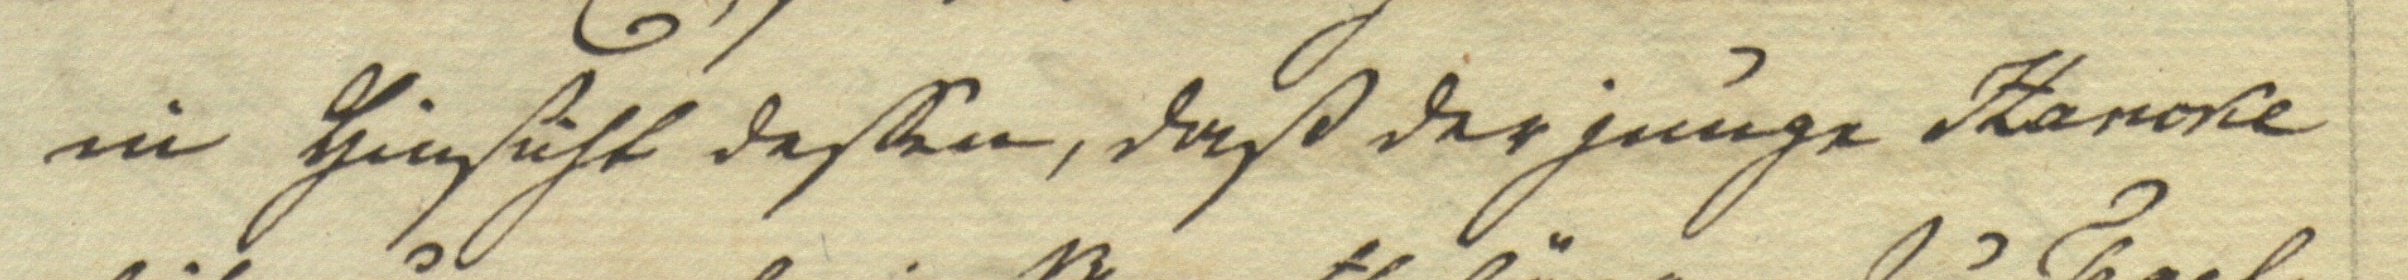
in Hinsicht dessen, daß der junge Hancke
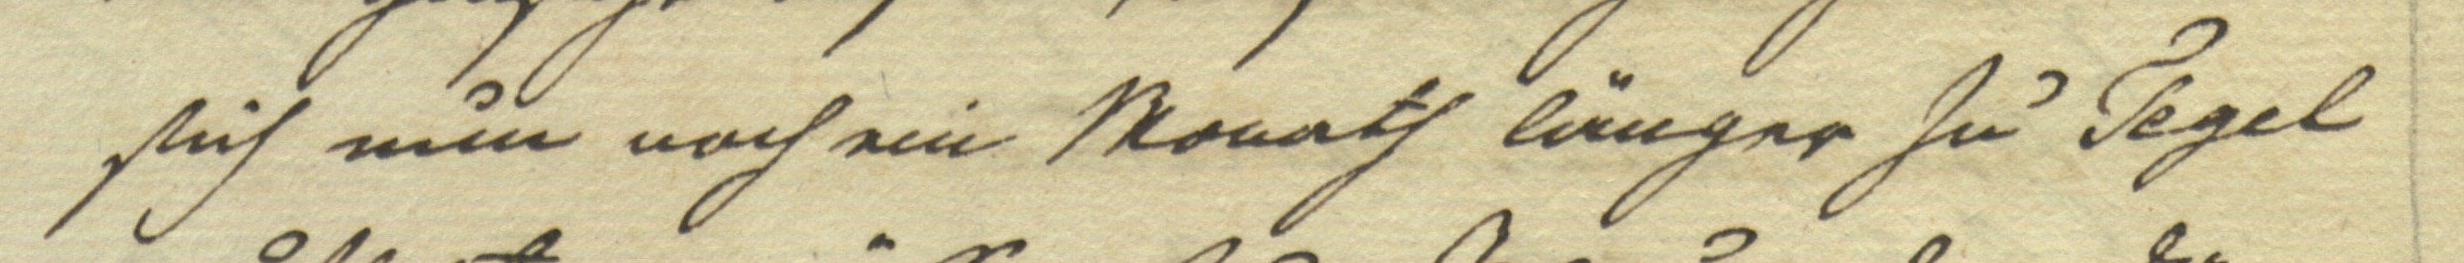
sich nun noch ein Monath länger zu Tegel
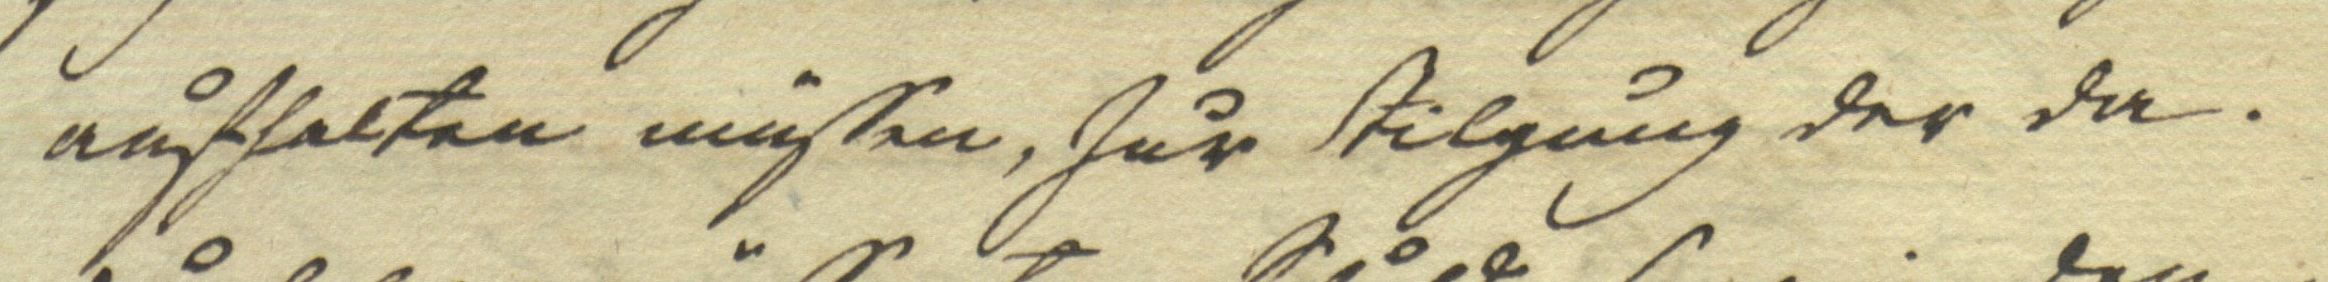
aufhalten müssen, zur Tilgung der da¬
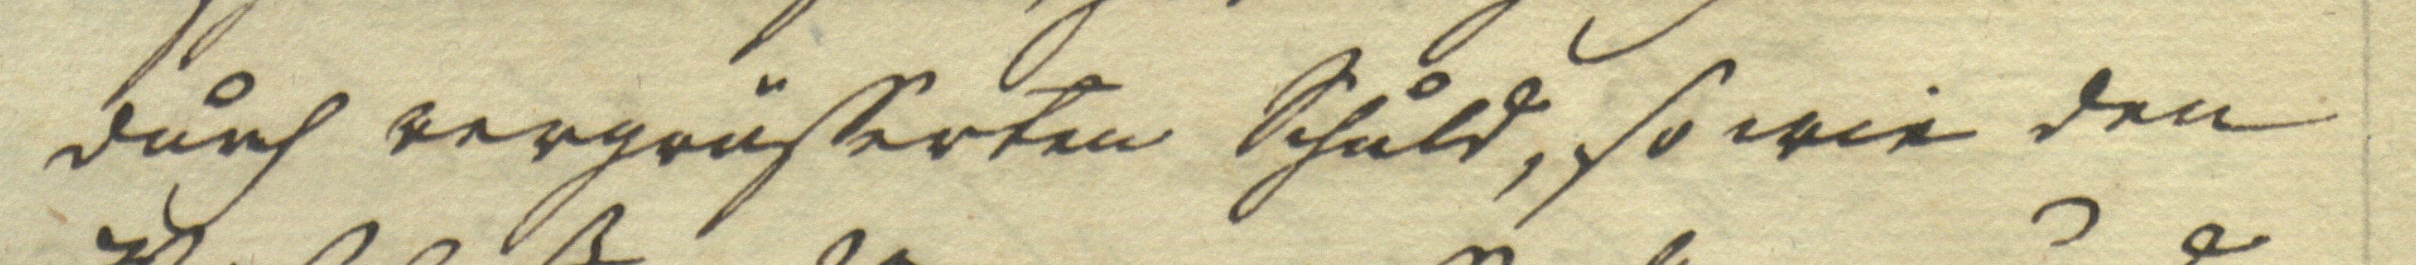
durch vergrösserten Schuld, so wie den
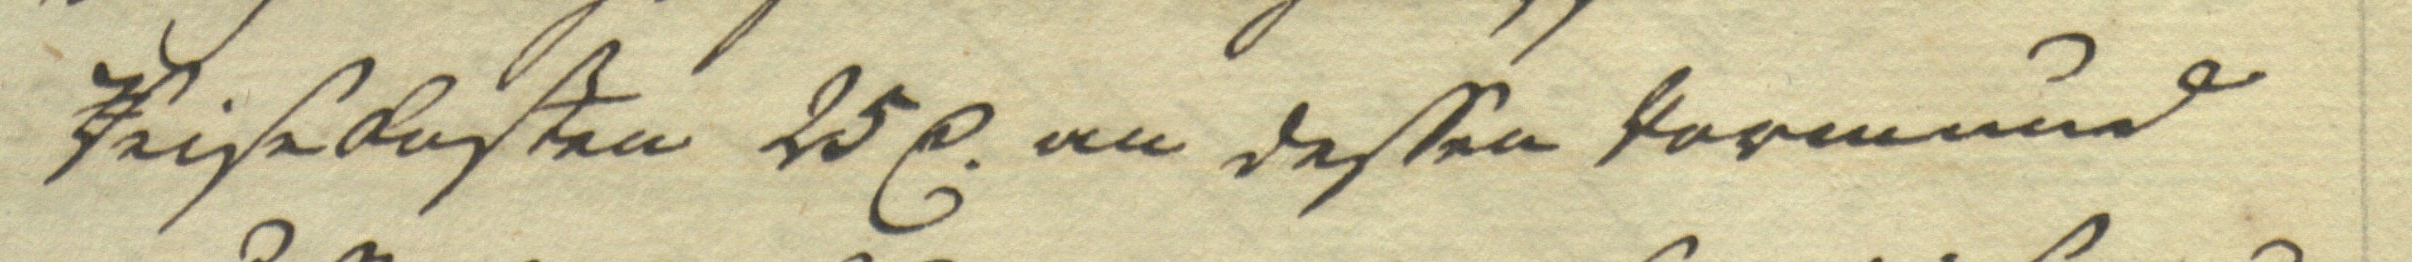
Reisekosten 25 l. an dessen Vormund
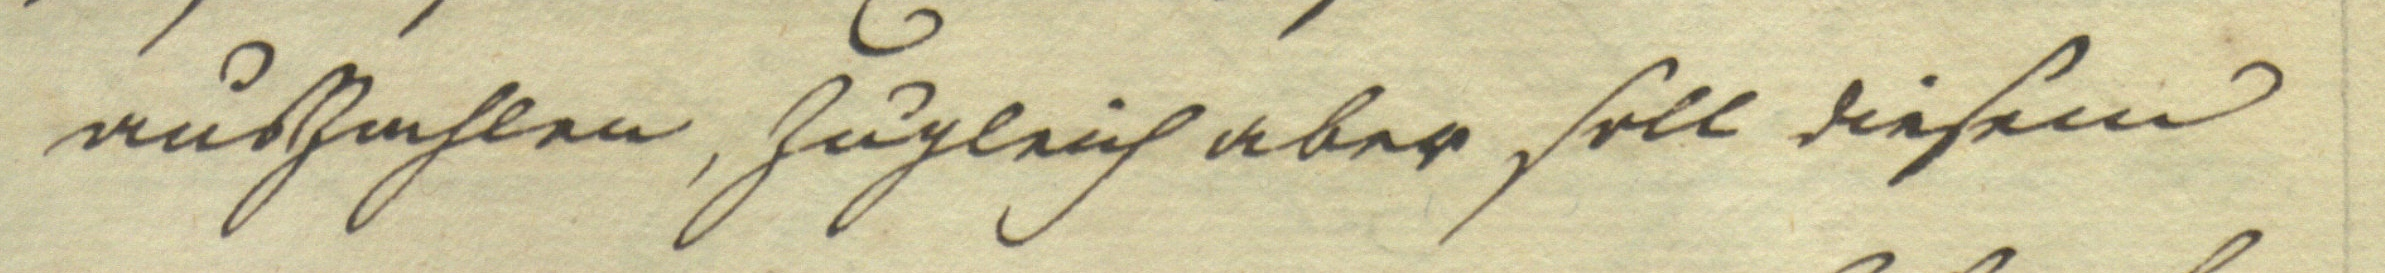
auszahlen, zugleich aber soll diesem
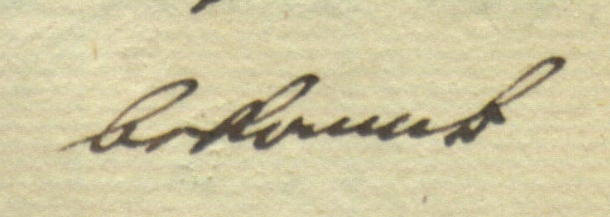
bekannt
